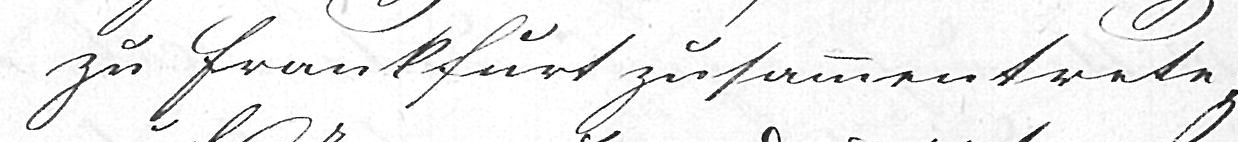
zu Frankfurt zusammentrete;
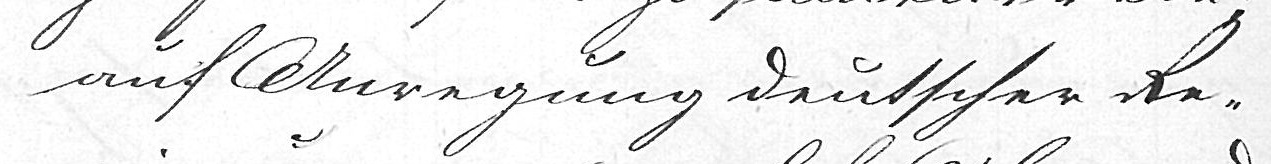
auf Anregung deutscher Re-
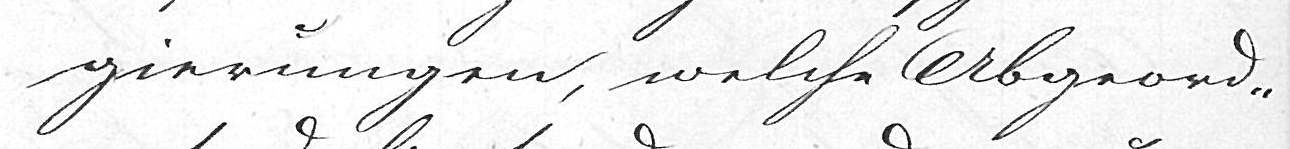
gierungen, welche Abgeord-
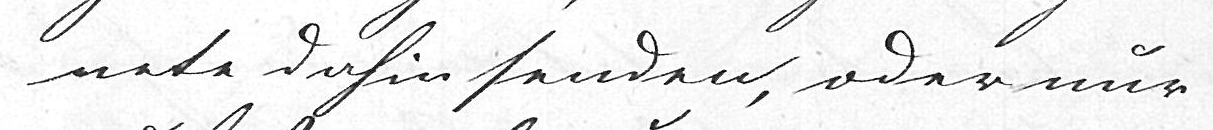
nete dahin senden, oder nur
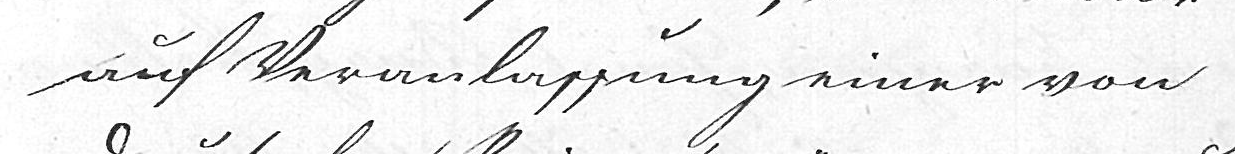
auf Veranlassung einer von
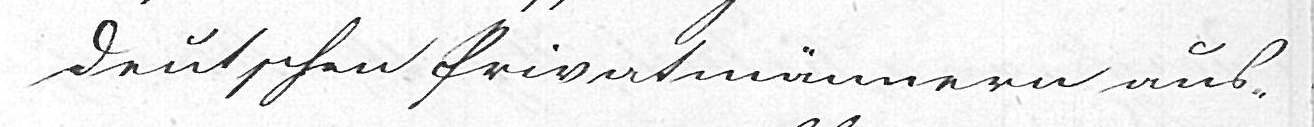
deutschen Privatmännern aus-
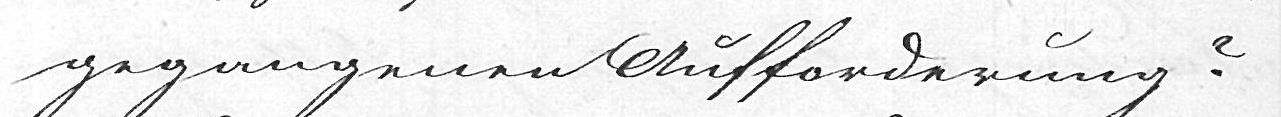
gegangenen Aufforderung?
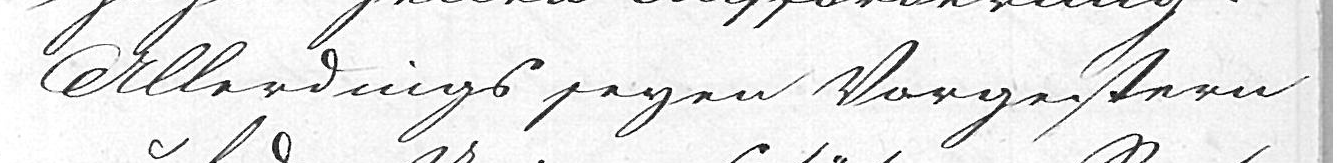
Allerdings seyen Vorgestern
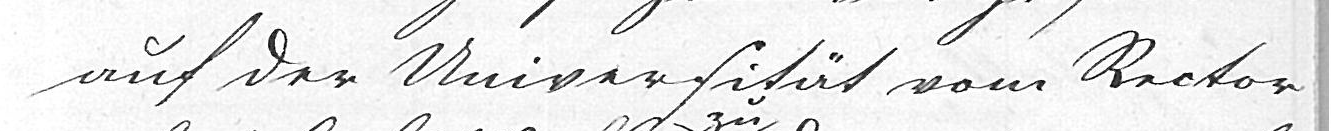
auf der Universität vom Rector
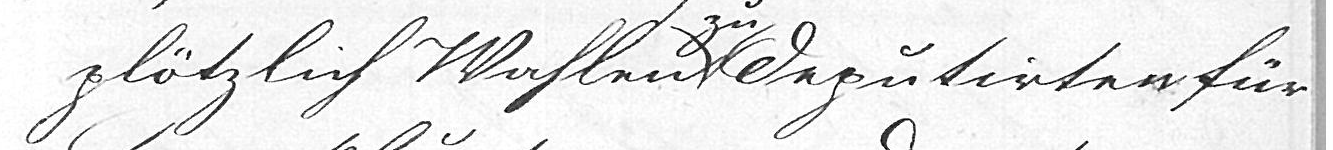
plötzlich Wahlen zu Deputirten für
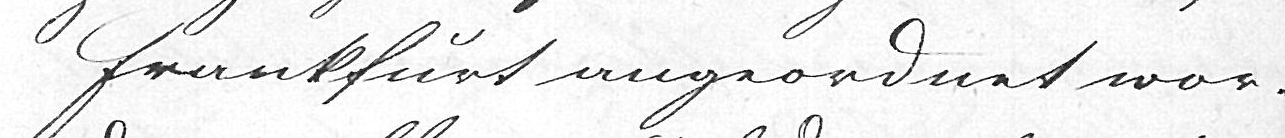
Frankfurt angeordnet wor-
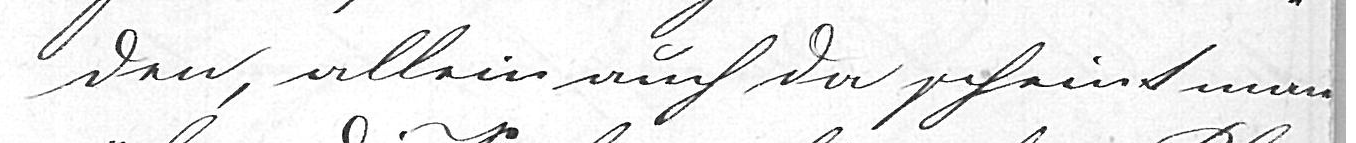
den, allein auch da scheint man
